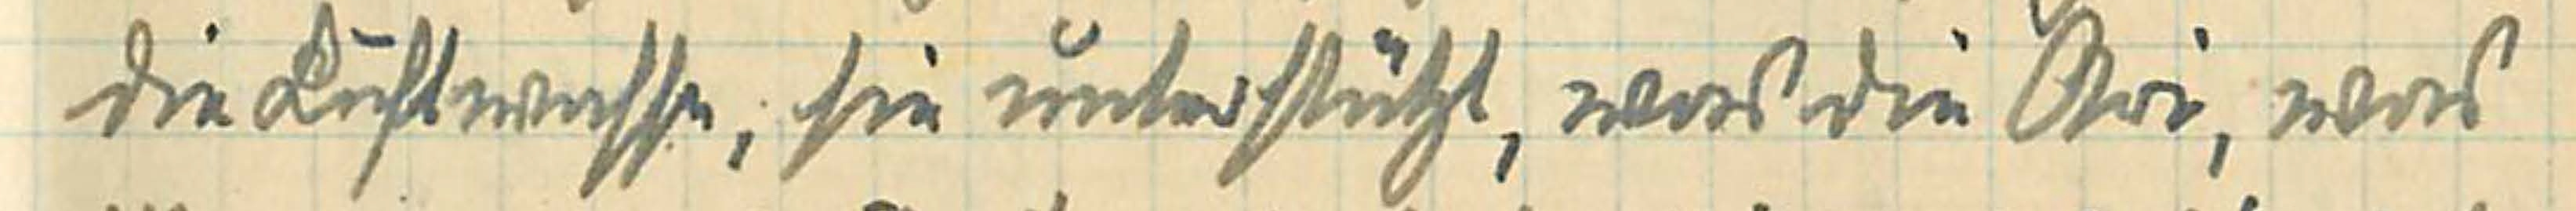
die Luftwaffe, sie unterstützt, was die Ari, was
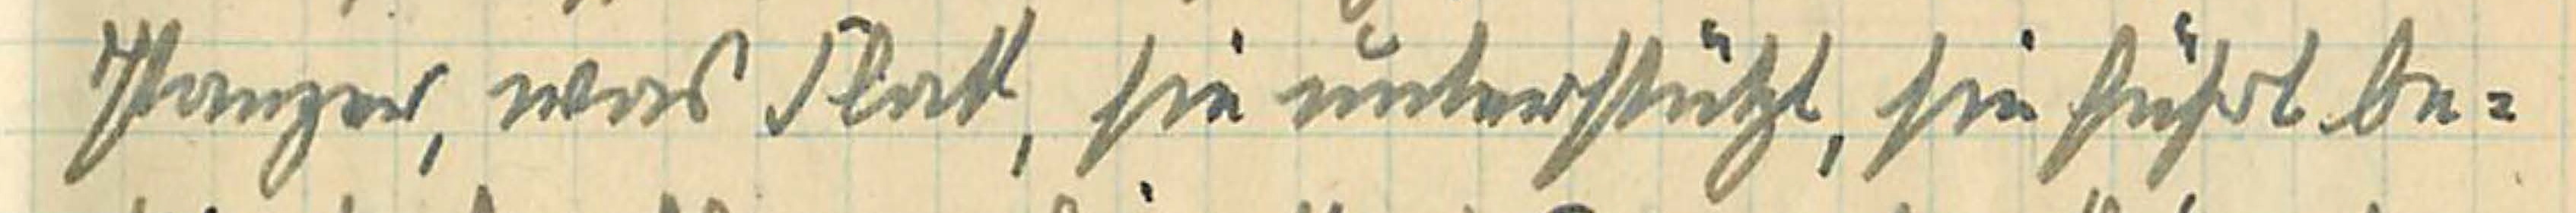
Panzer, was Flak, sie unterstützt, sie führt be-
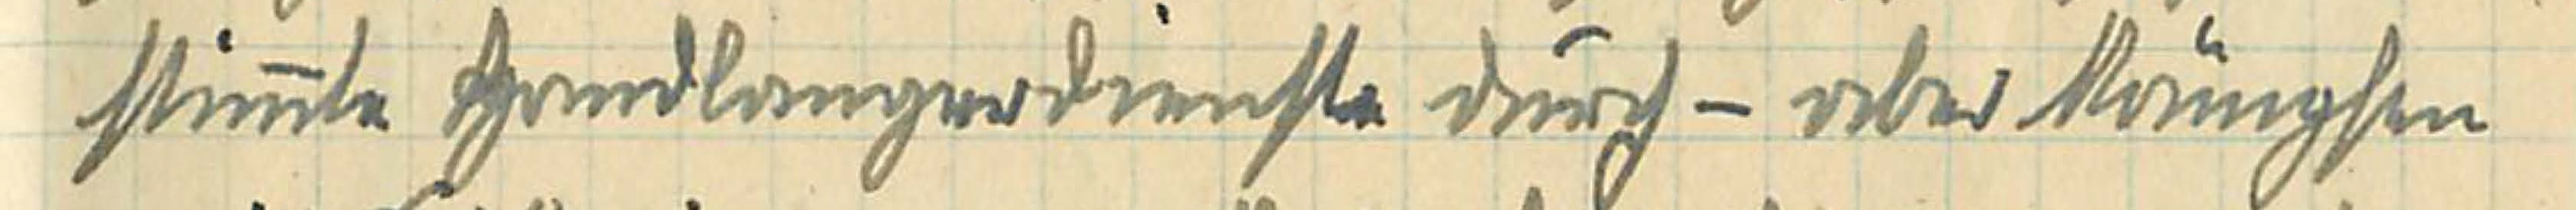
stimmte Handlangerdienste durch – aber kämpfen
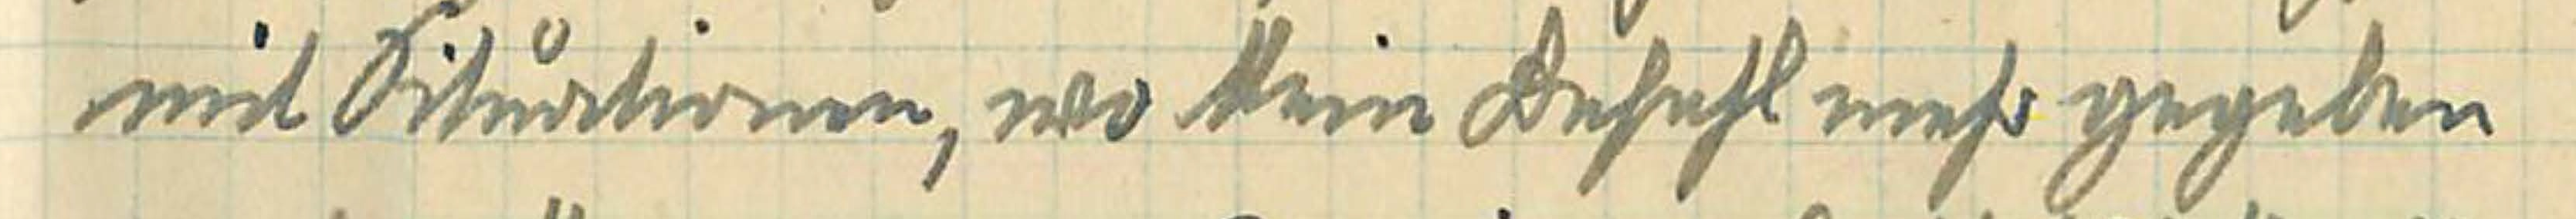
mit Situationen, wo kein Befehl mehr gegeben
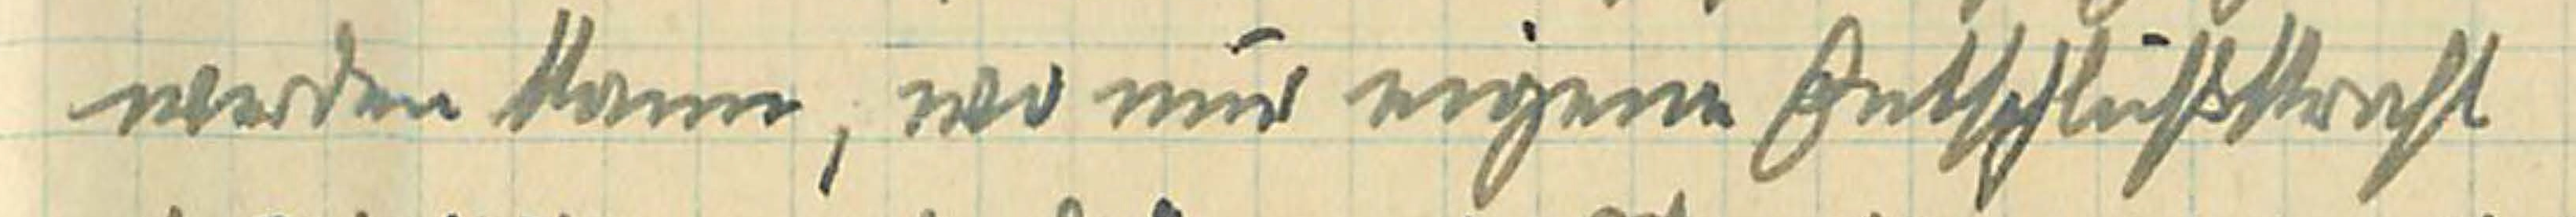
werden kann, wo nur eigene Entschlußkraft
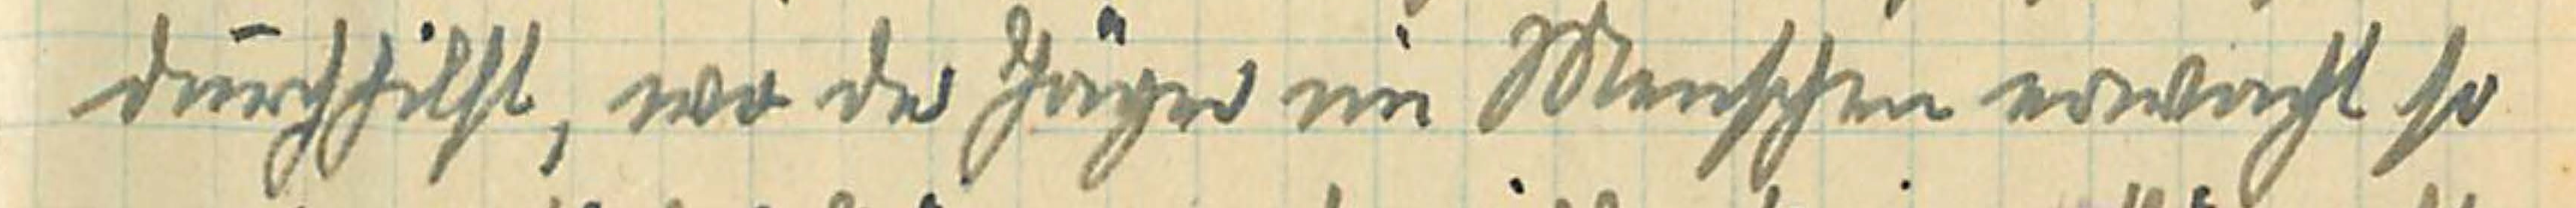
durchhilft, wo der Jäger im Menschen erwacht so
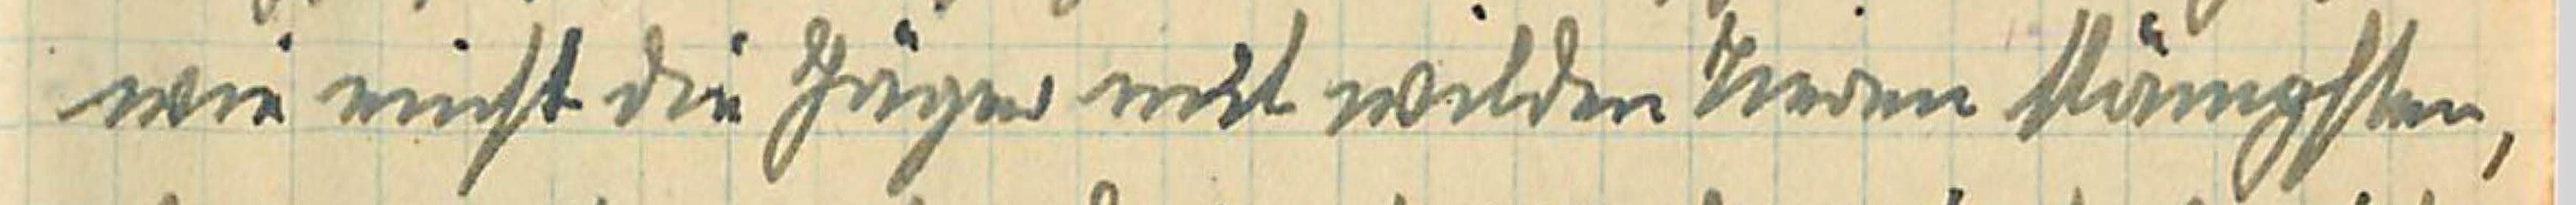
wie einst die Jäger mit wilden Tieren kämpften,
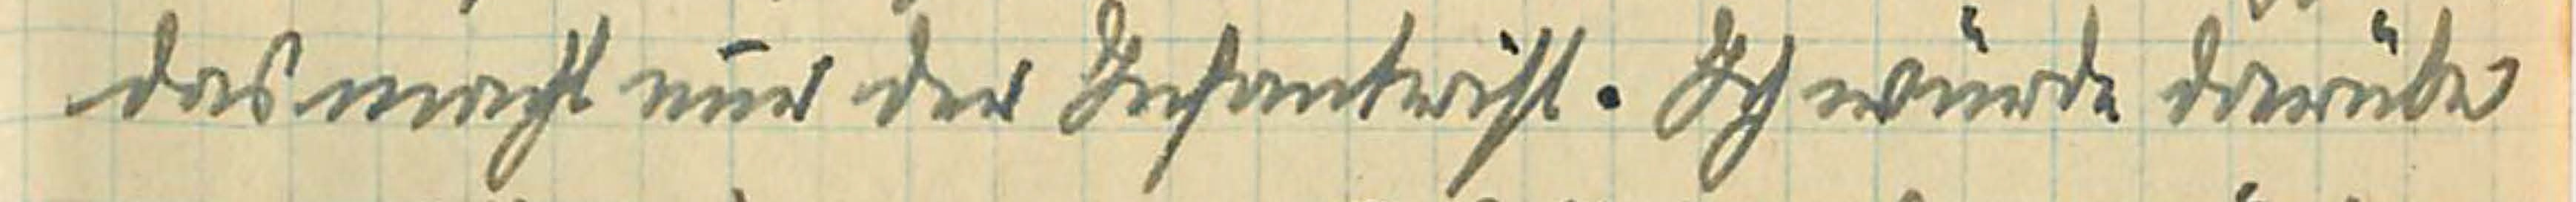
das macht nur der Infanterist. Ich würde darüber
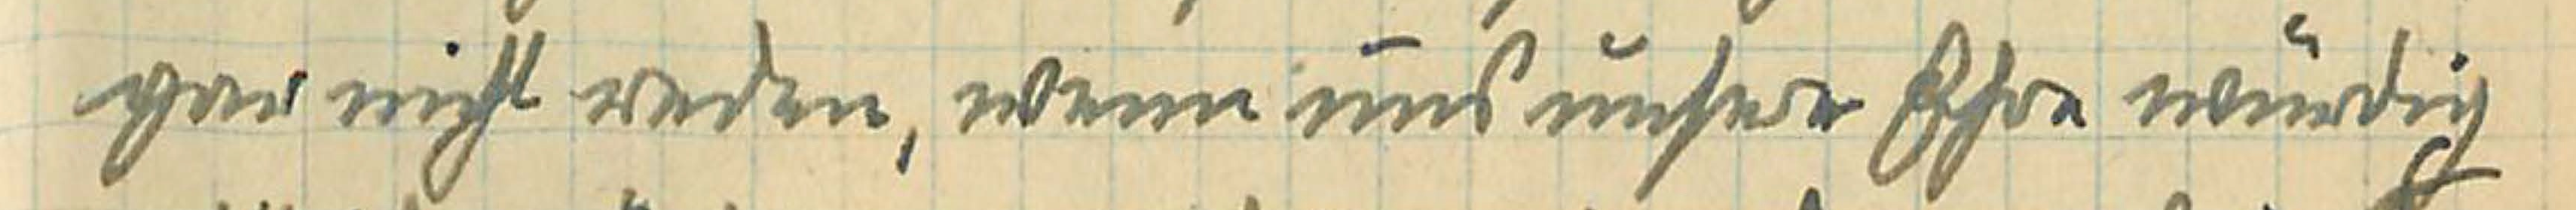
gar nicht reden, wenn uns unsere Ehre würdig
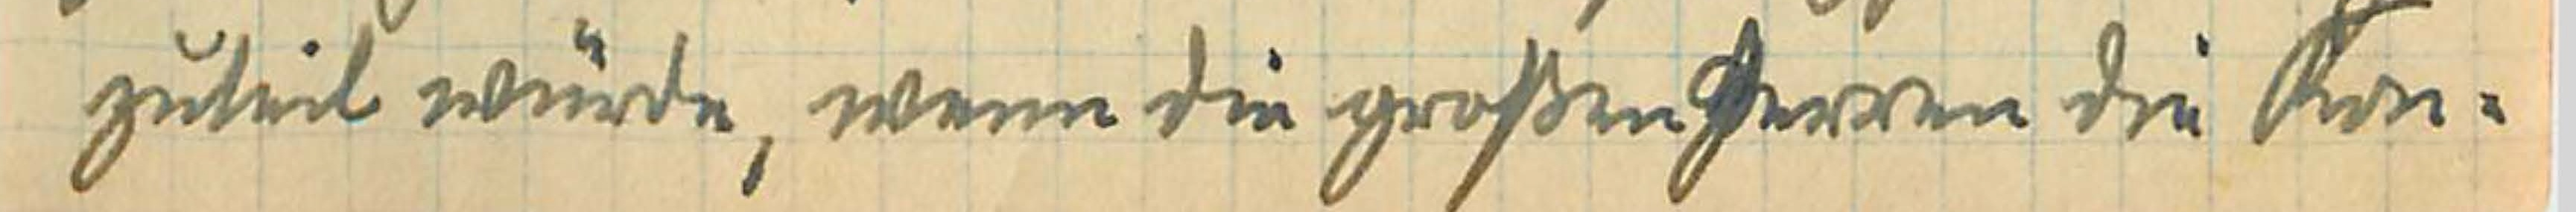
zuteil würde, wenn die großen Herren die Kon-
